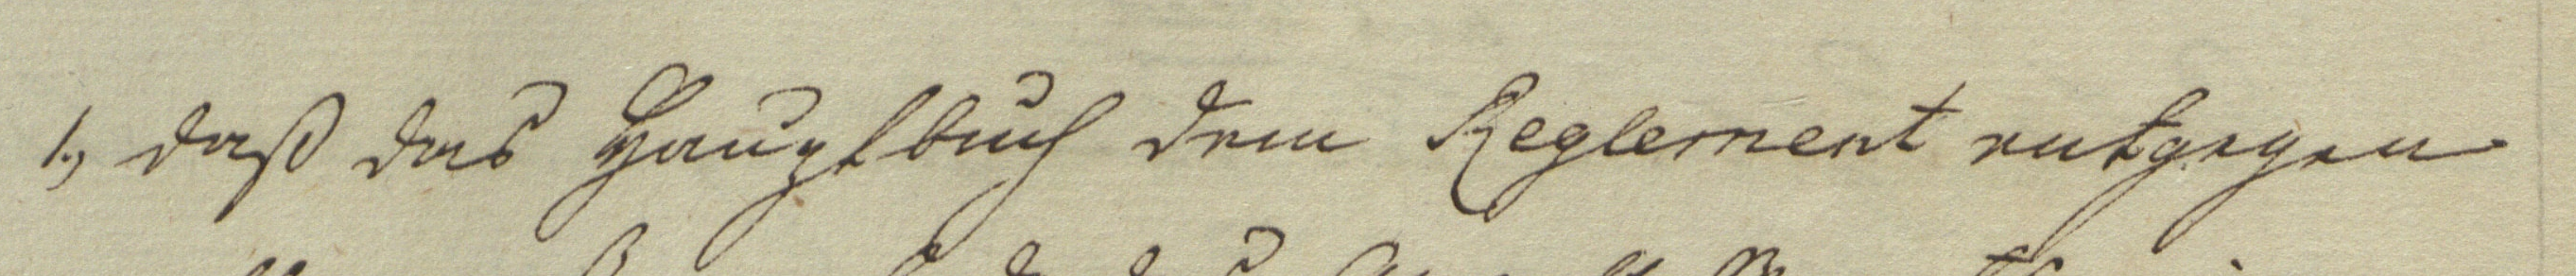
1., daß das Hauptbuch dem Reglement entgegen
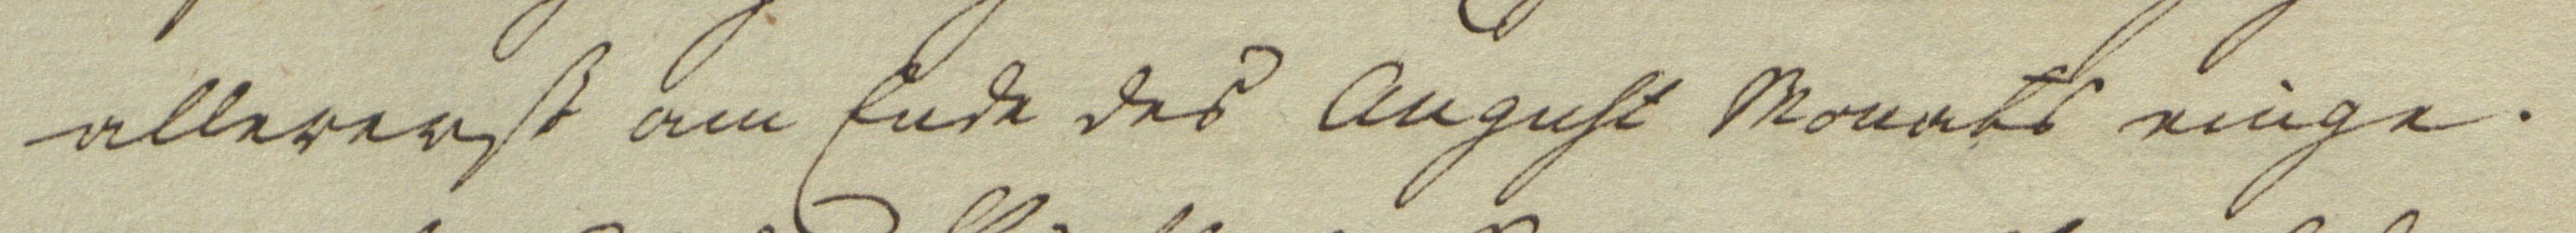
allererst am Ende des August Monats einge¬
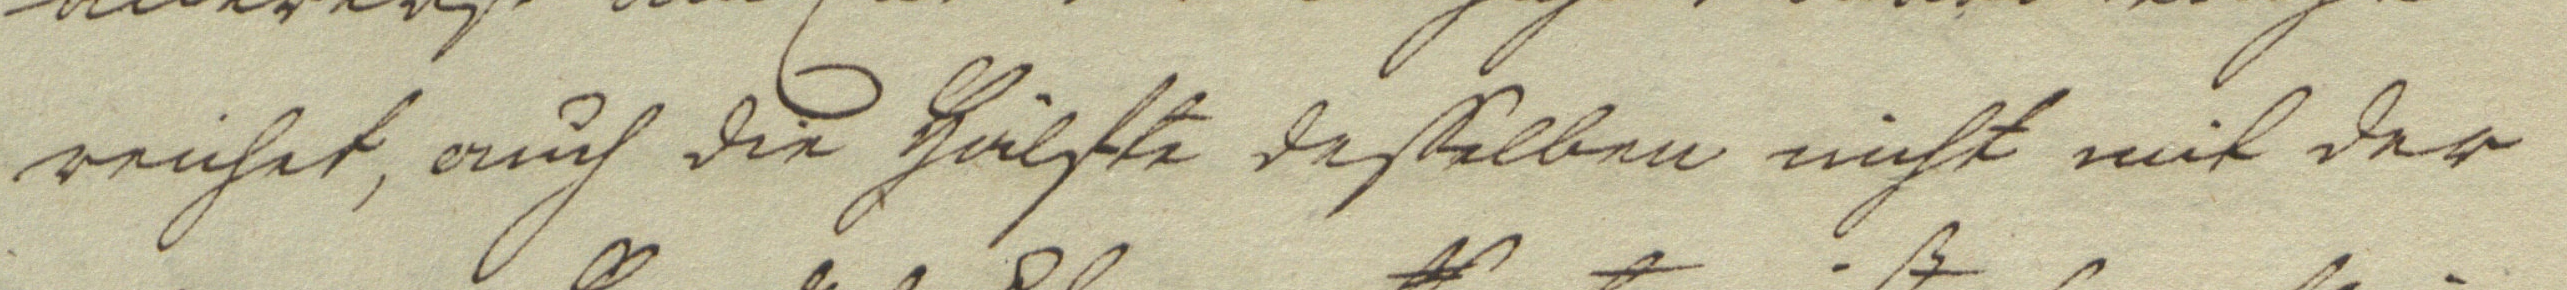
reichet, auch die Hälfte desselben nicht mit der
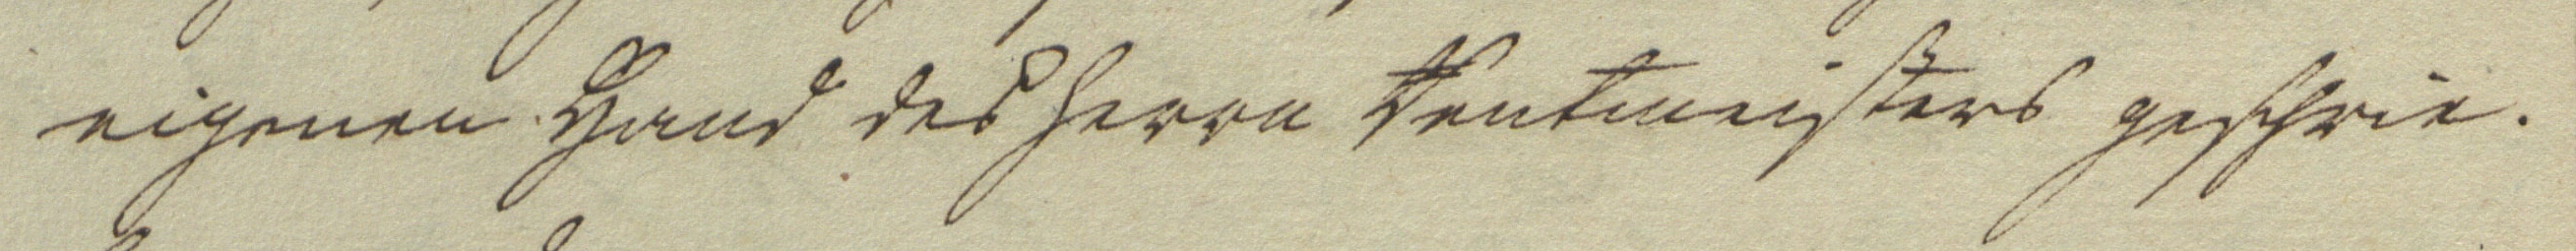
eigenen Hand des Herrn Rentmeisters geschrie¬
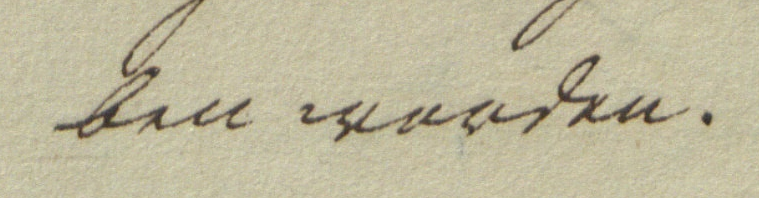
ben worden.
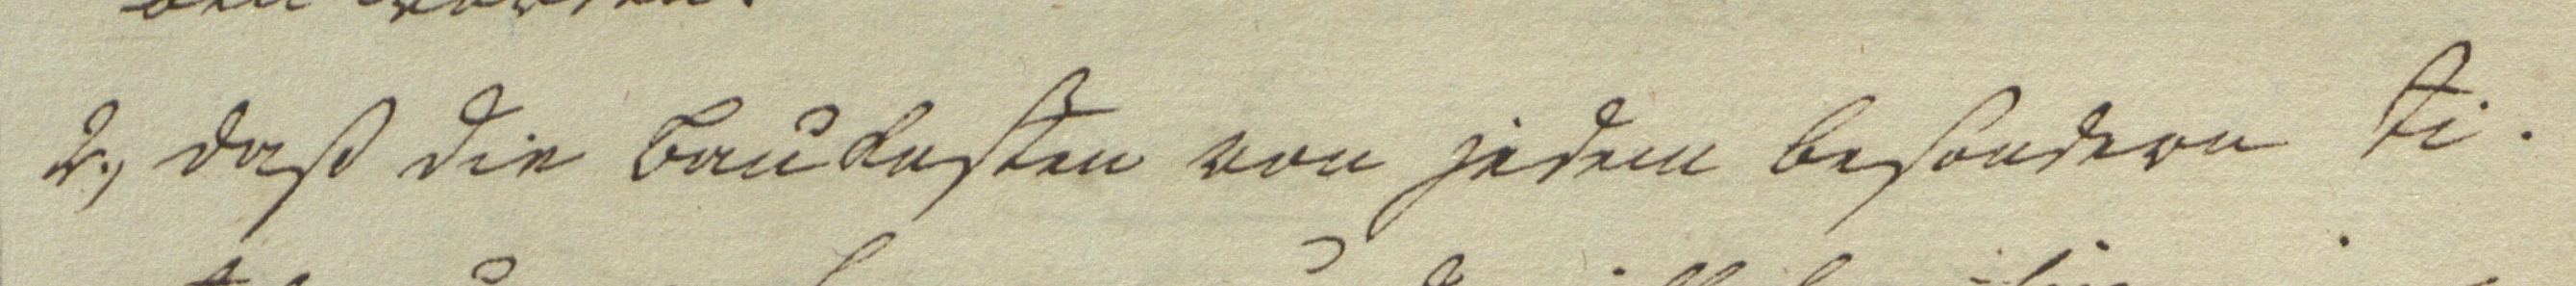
2., daß die Baukosten von jedem besondern Ti¬
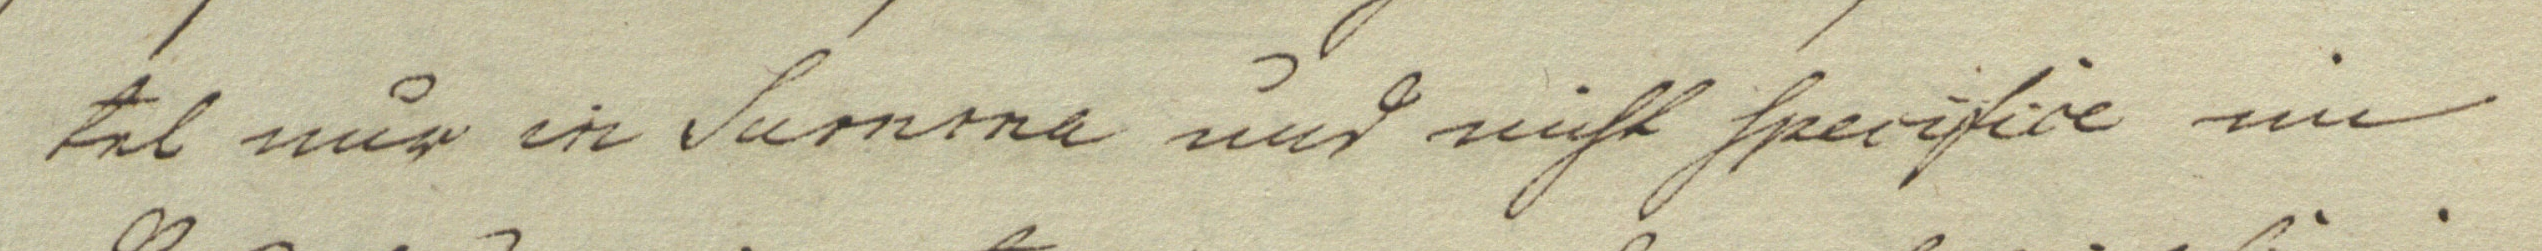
tel nur in Summa und nicht specifice im
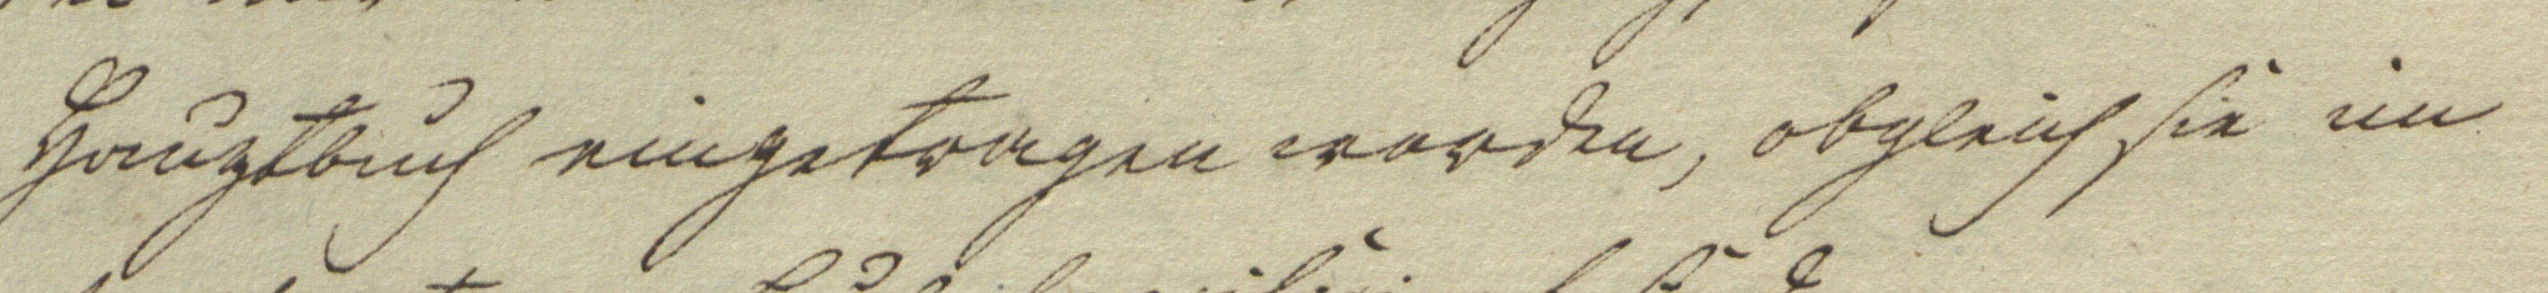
Hauptbuch eingetragen worden, obgleich sie im
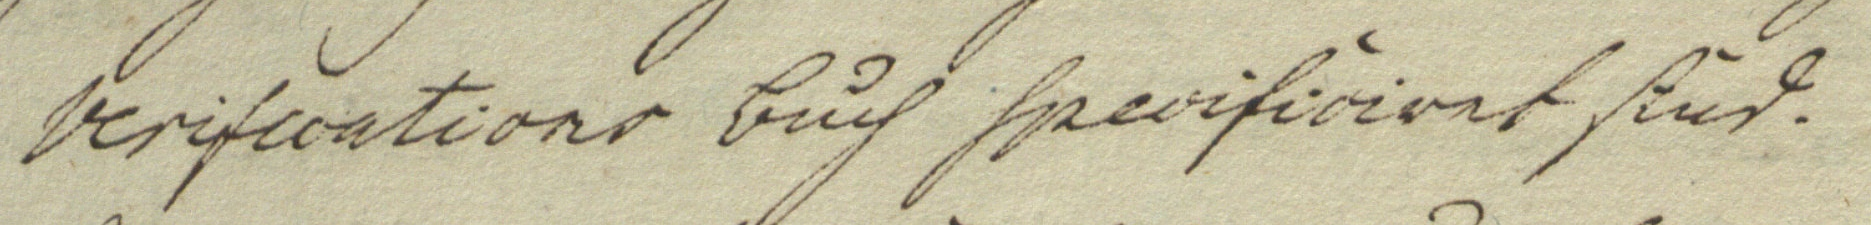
Verifications Buch specificiret sind.
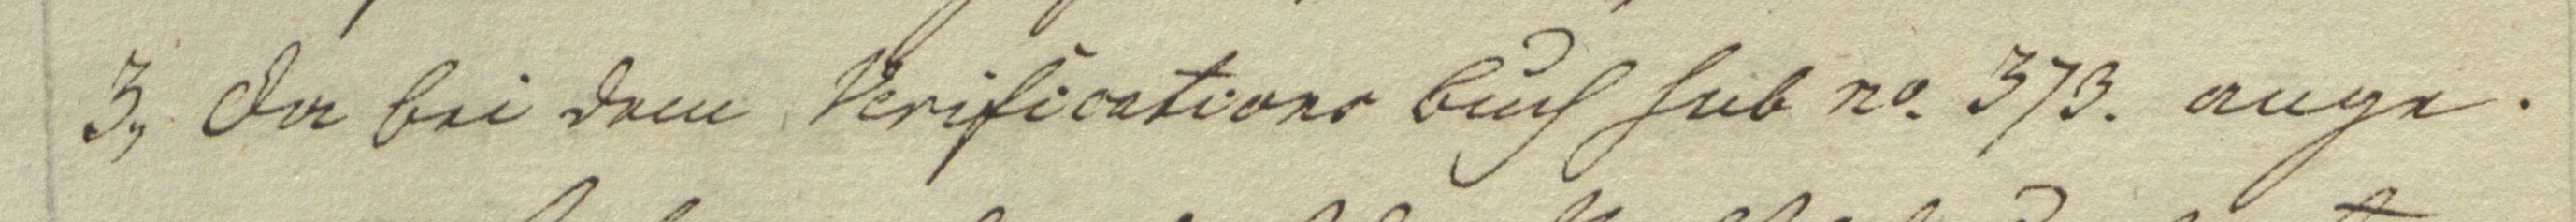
3., Da bei dem Verifications Buch sub No 373. ange¬
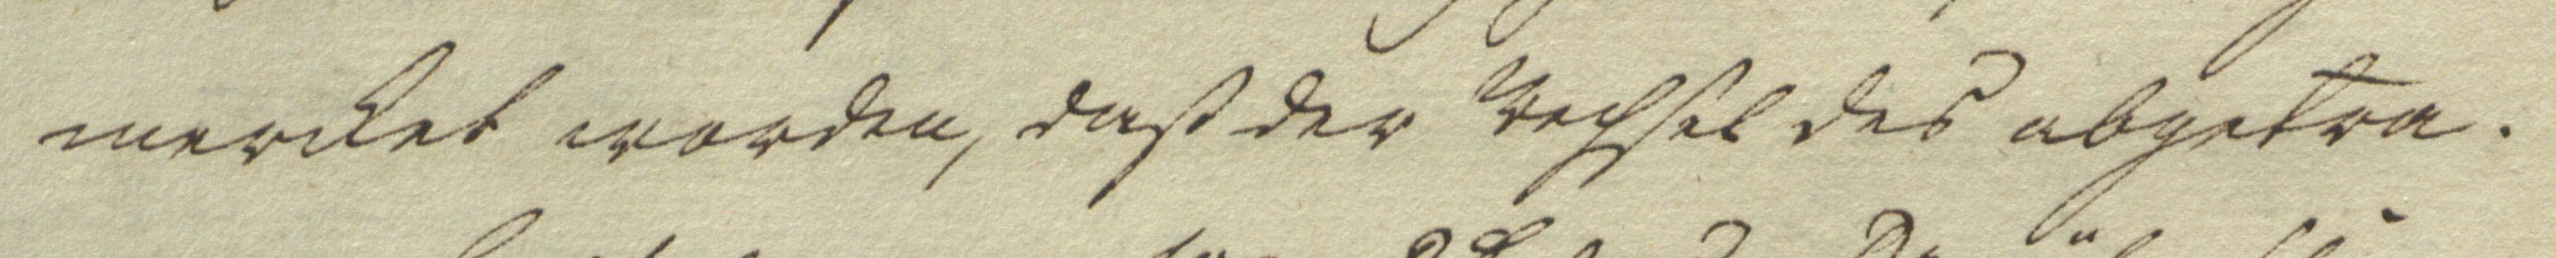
mercket worden, daß der Wechsel des abgetra¬
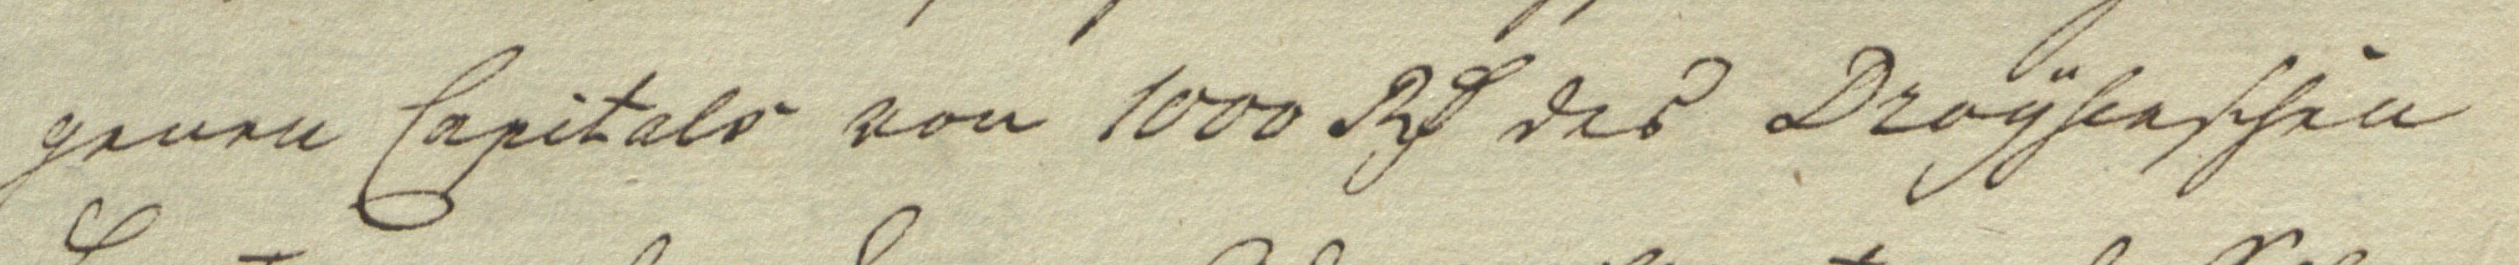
genen Capitals von 1000 Rf des Droÿsenschen
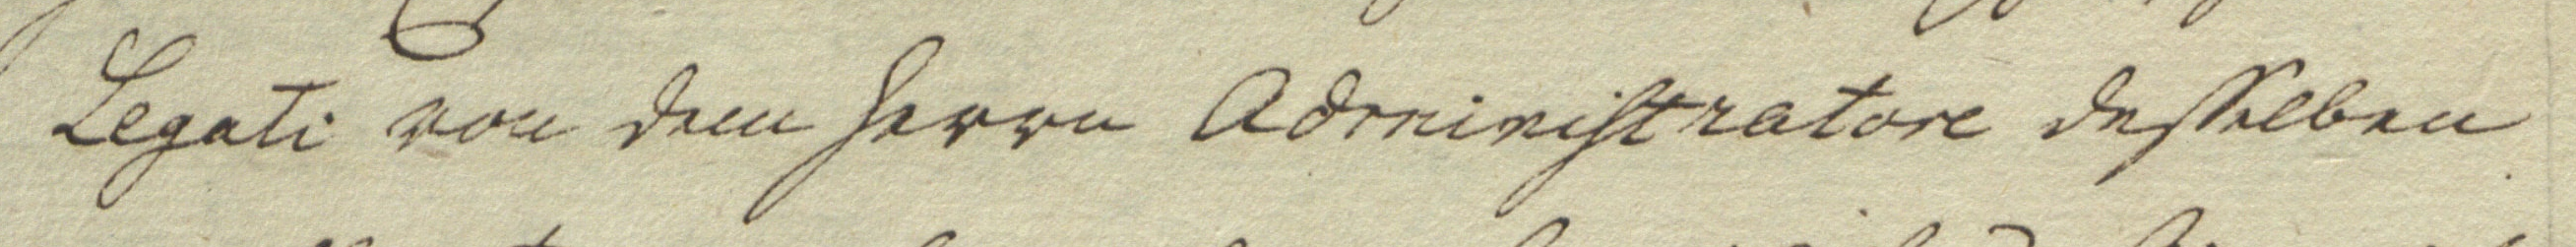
Legati von dem Herrn Administratore desselben
